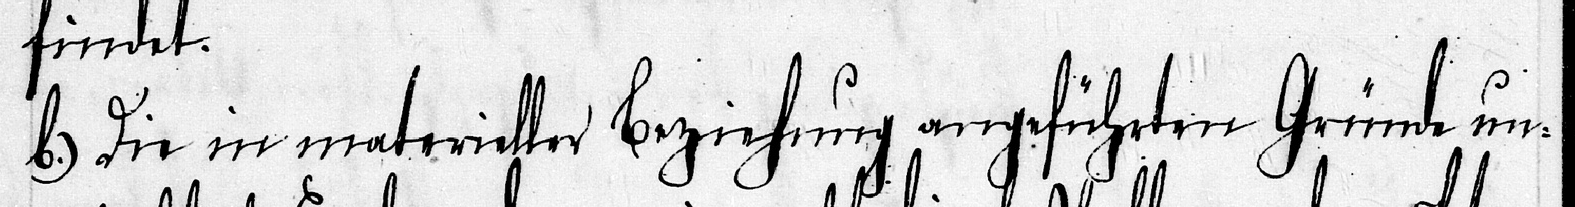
b.) Die in materieller Beziehung angeführten Gründe un¬
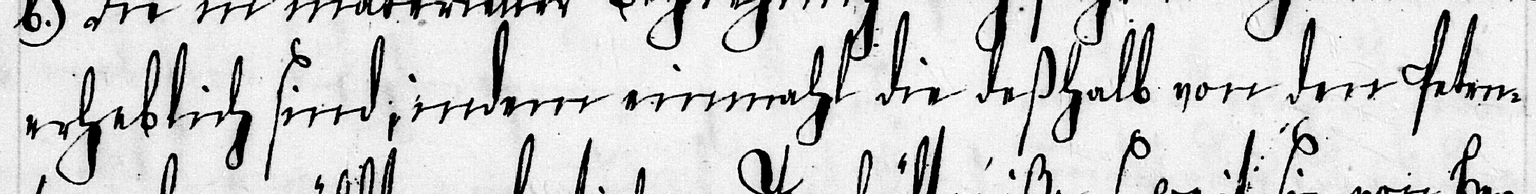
erheblich sind, indem einmahl die deßhalb von den Peten¬
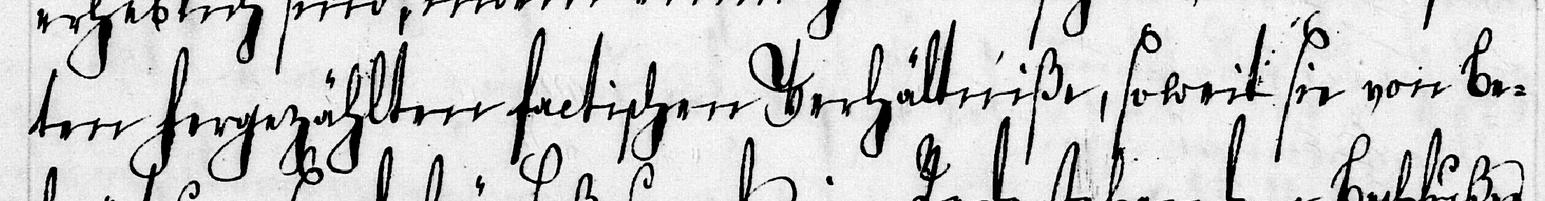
ten hergezählten factischen Verhältniße, soweit sie von Be¬
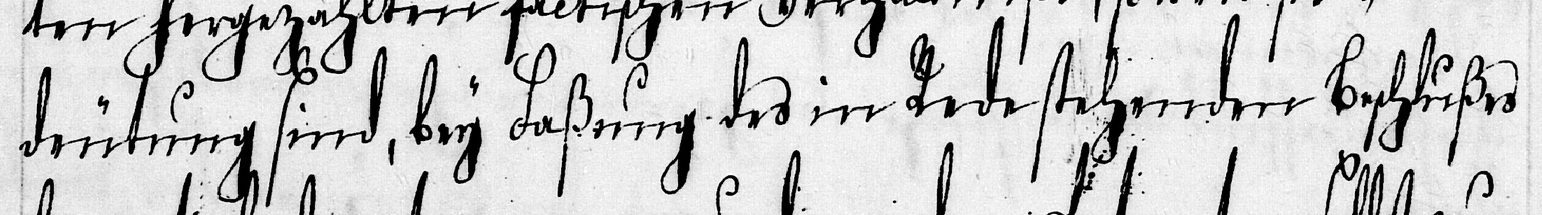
deutung sind, bey Faßung des in Rede stehenden Beschlußes
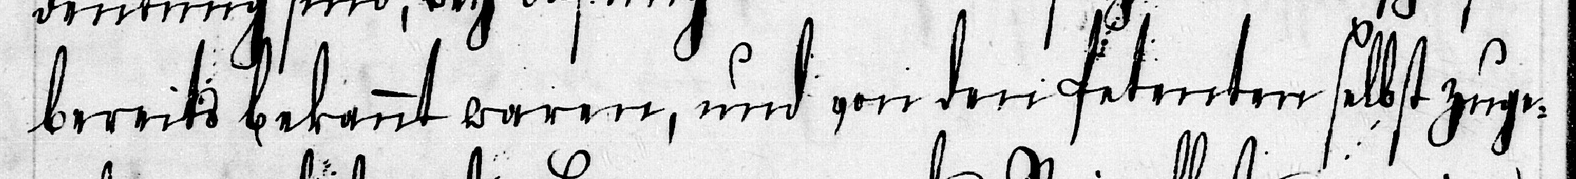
bereits bekannt waren, und von den Petenten selbst zug¬
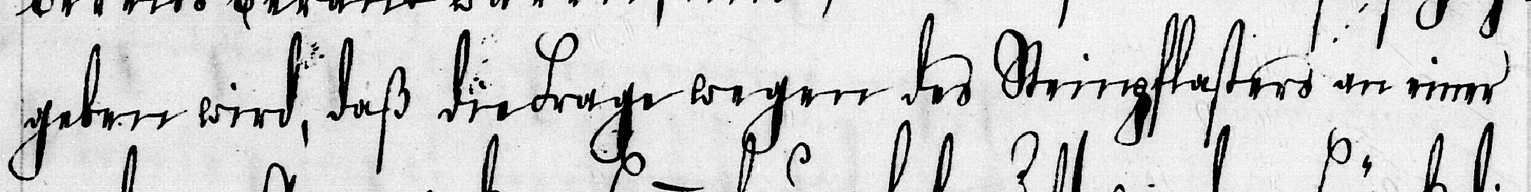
egeben wird, daß die Frage wegen des Steinpflasters an einer
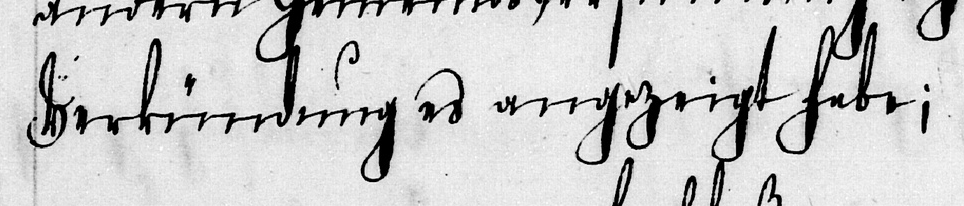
Verkündung es angezeigt habe;
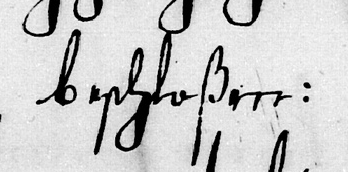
beschloßen:
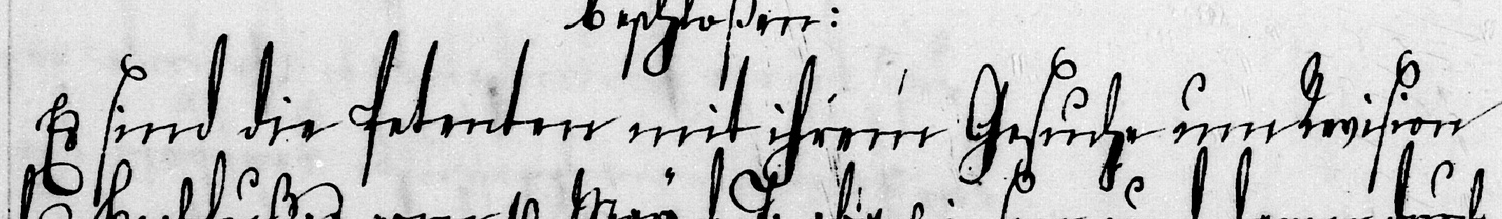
Es sind die Petenten mit ihrem Gesuche um Revision
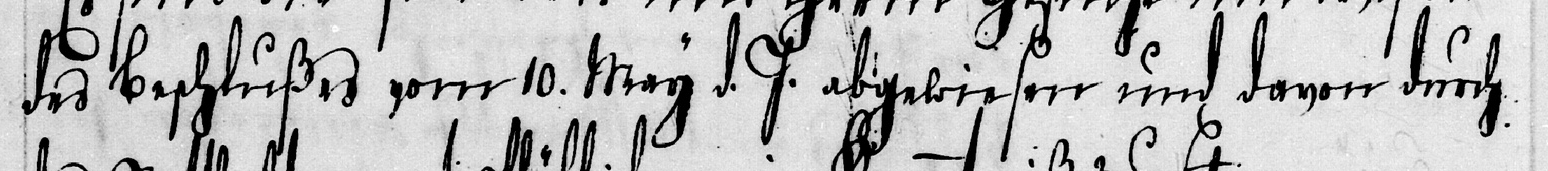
des Beschlußes vom 10. May d. J. abgewiesen und davon durch
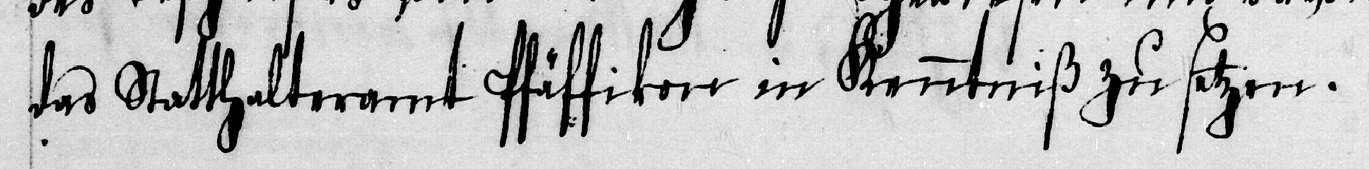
das Statthalteramt Pfäffikon in Kenntniß zu setzen.
